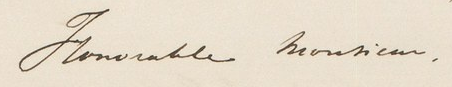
Honorable Monsieur,
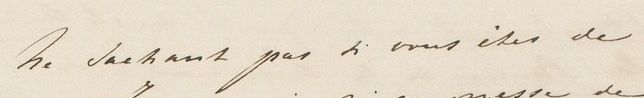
Ne sachant pas si vous êtes de
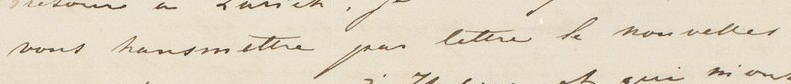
vous transmettre par lettre le nouvelles
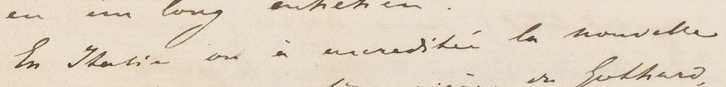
En Italie on à encreditée la nouvelle
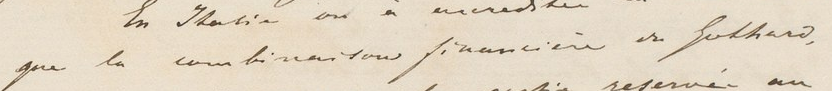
que la combinaison financière du Gothard,
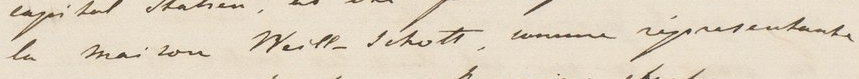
la maison Weill-Schott, comme répresentants
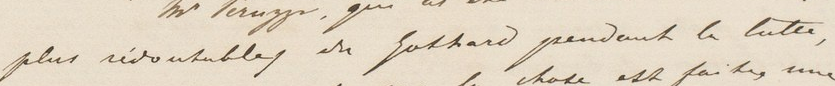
plus rédoutables du Gothard pendant la lutte,
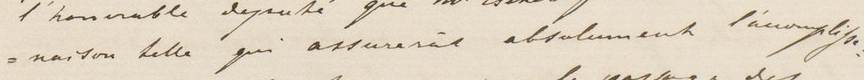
naison telle qui assurerât absolument l'accomplisse-
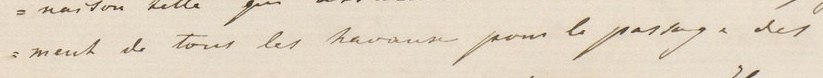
ment de tous les travaux pour le passage des
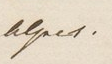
Alpes.
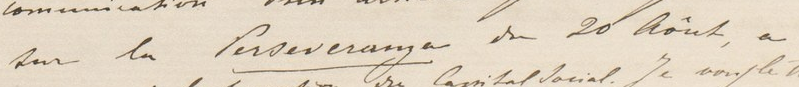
sur la Perserveranza de 20 Août, a
